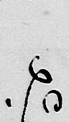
des
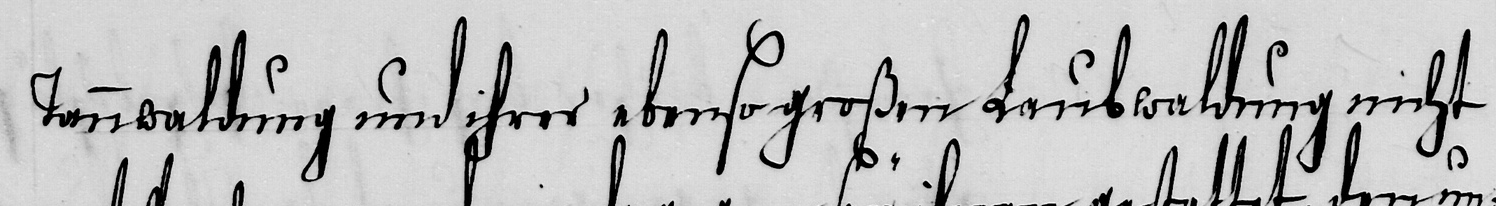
Tannwaldung und ihrer ebensogroßen Laubwaldung nicht
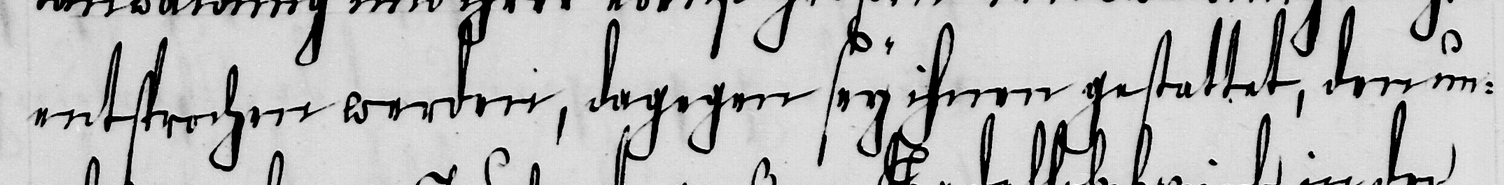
entsprochen werden, dagegen sey ihnen gestattet, den un¬
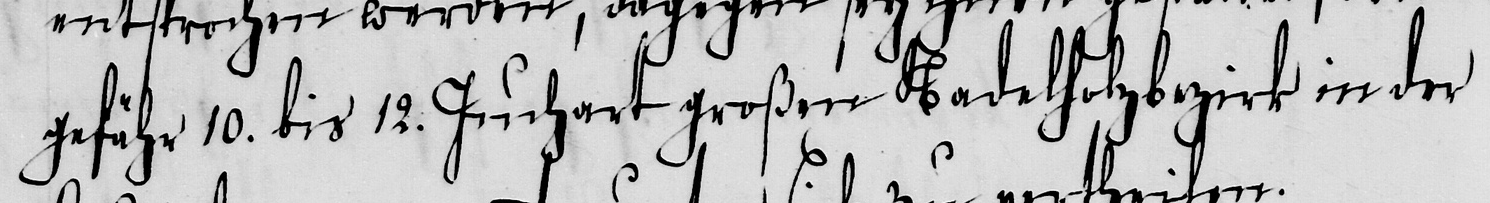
gefähr 10. bis 12. Juchart großen Nadelholzbezirk in der
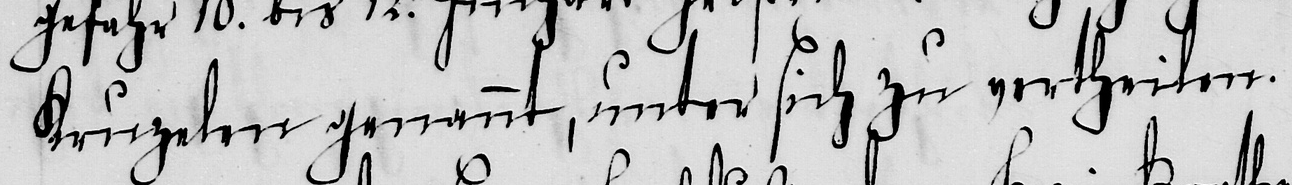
Kruzelen genannt, unter sich zu vertheilen.
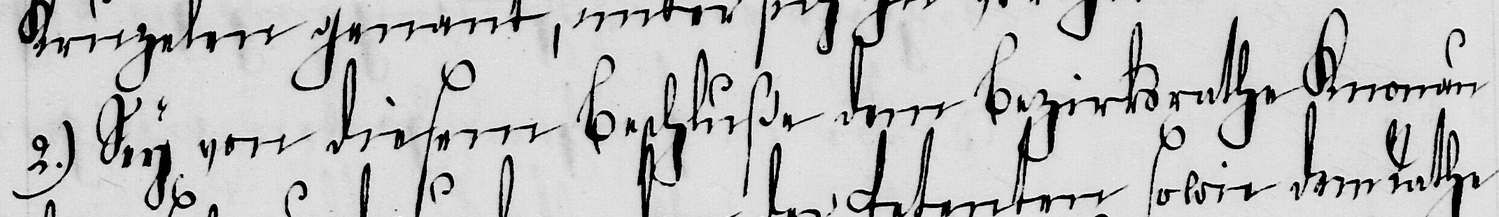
2.) Sey von diesem Beschluße dem Bezirksrathe Knonau
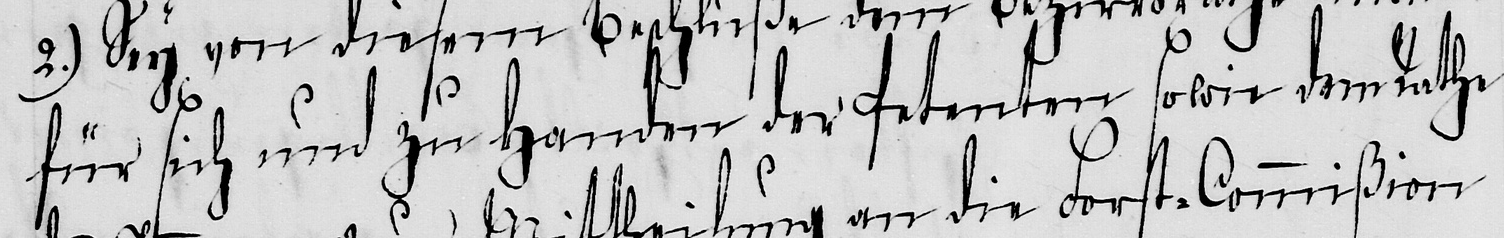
für sich und zu Handen der Petenten sowie dem Rathe
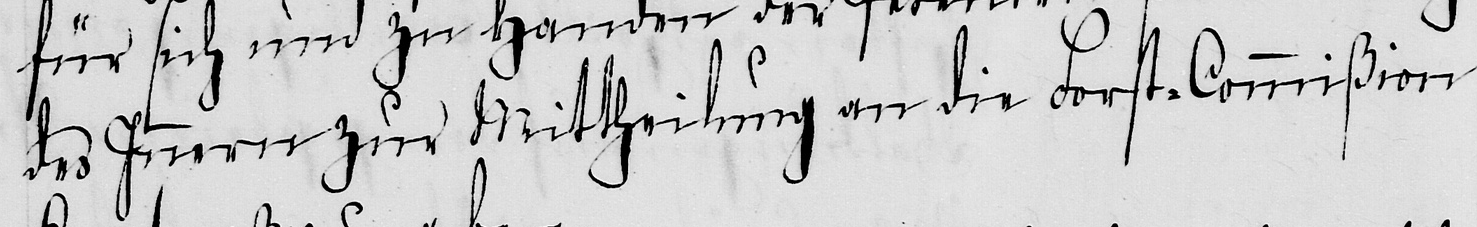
des Innern zur Mittheilung an die Forst-Commißion
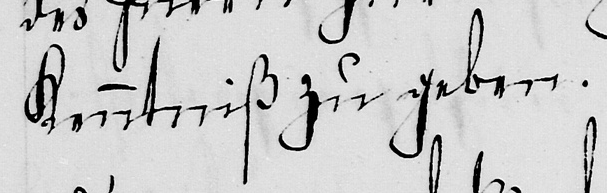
Kenntniß gegeben,
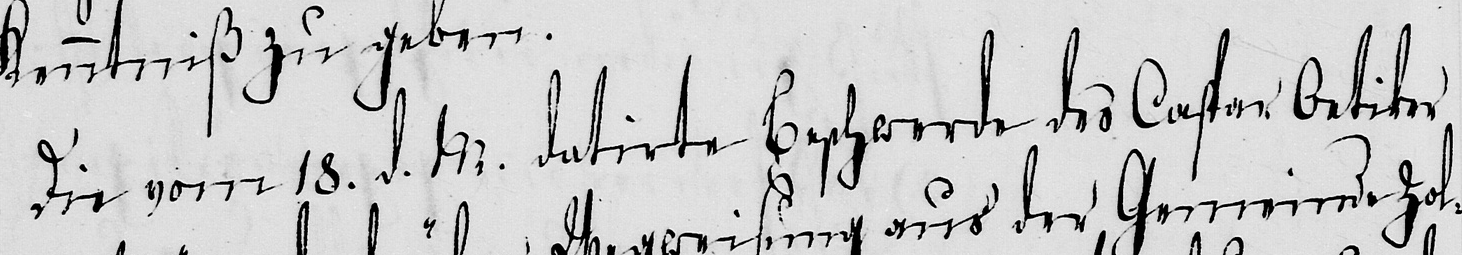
Die vom 18. d. M. datirte Beschwerde des Caspar Oetiker
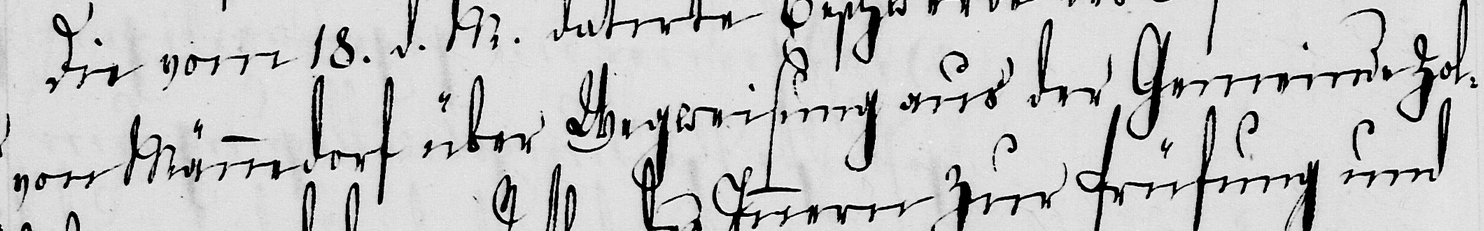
von Männedorf über Wegweisung aus der Gemeinde Zol¬
